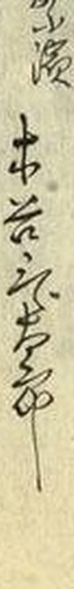若州木谷三郎太郎
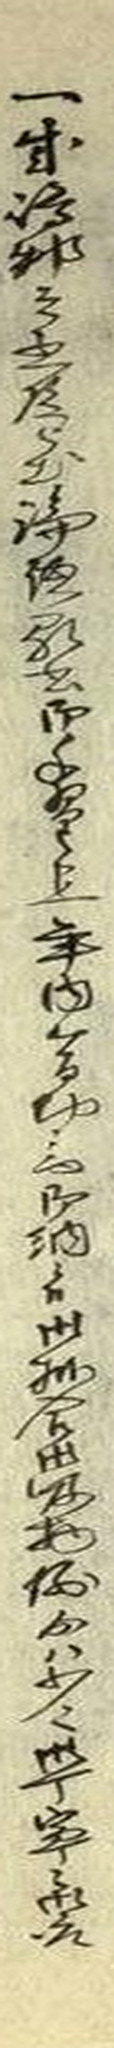一成嶋邦之丞殿被出論語歌書御手習被申上年内今日切ニ而御納ニ付御掛合御吸物例ゟハ少々御丁寧ニ御取
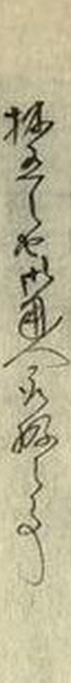扱有之由御用人取扱之事
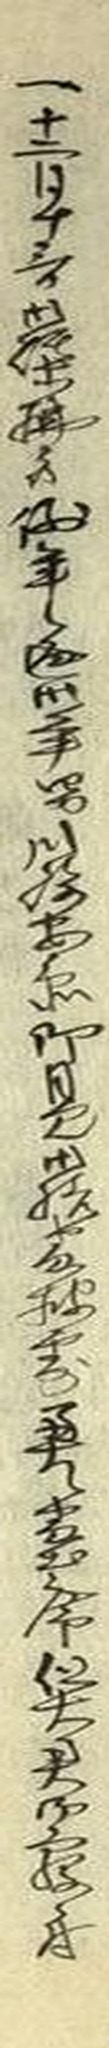一十二月十三日御煤払ニ付例年之通御年男川崎安兵衛御目見御膳番披露奥之番出席但大奥御寝ニ付
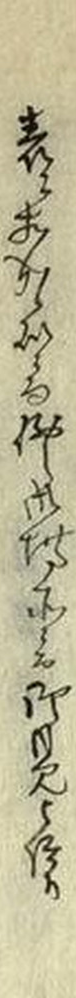表ニ相成候処ニ而例之御場所ニ而御目見被仰付
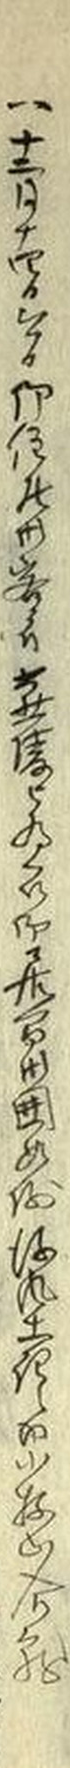一十二月十四日今日御住居御客ニ付燕凌被為召御居間御囲如例後風土記之内小牧山合戦
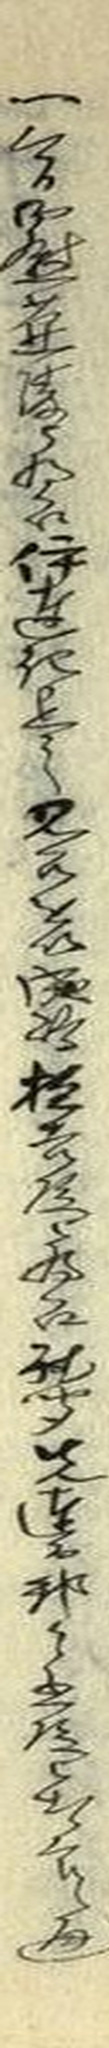一今日御慰燕凌被為召伊達記申上之思召を以成嶋桓吉殿被為召聴聞先達而邦之丞殿被出候節之通
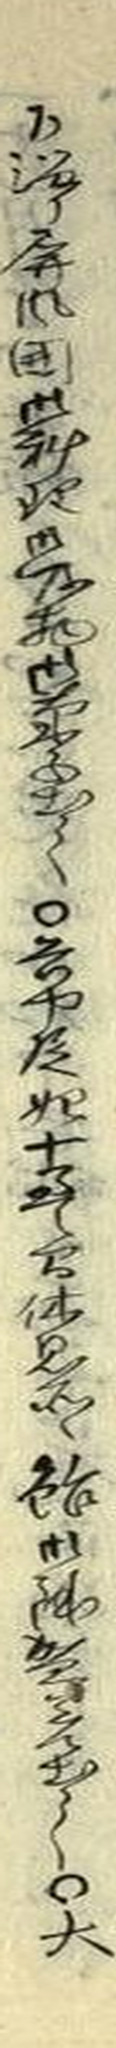下溜り屛風囲御料理御吸物御菓子出之〇谷中殿始十畳之間休息所へ鮓御鉢盛差出之〇大
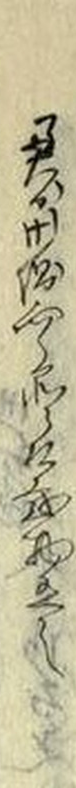奥ゟ御側向へ品々頂戴物有之
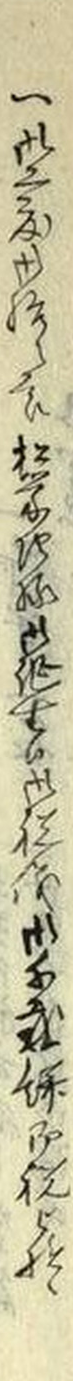一御二度御膳之節松栄院様御誕生日御祝儀御千載餅御祝被遊候
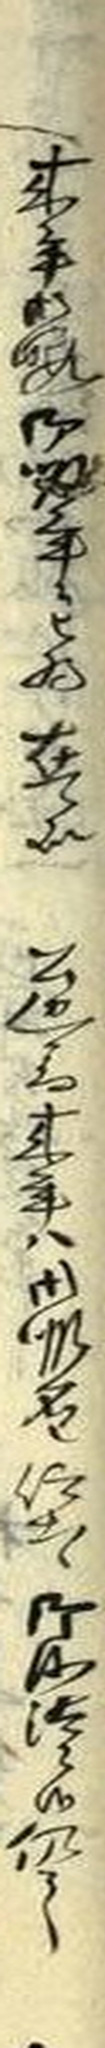来年御暇御順年ニ被為在候処公辺ニ而来年ハ御名被仰出候御沙汰ニ候依之
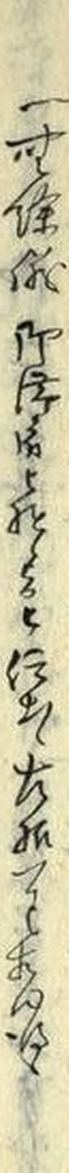無余儀御滞府被遊候旨被仰出候左様可被相心得候
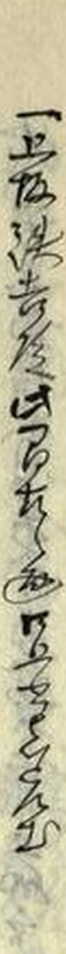一上坂鉄吉殿此間左之通御上書被差出
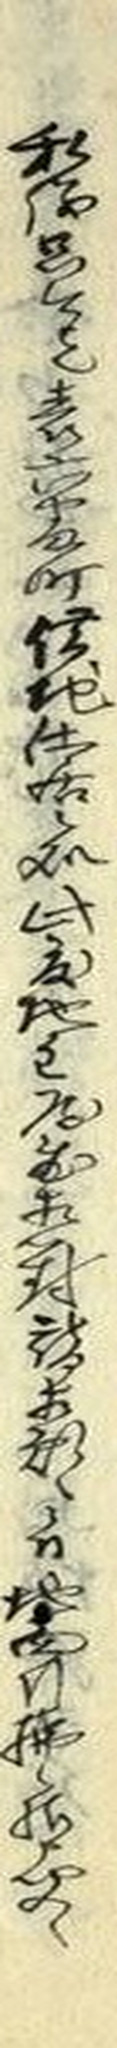私儀只今迄表六番町借地仕居候処此度地主屋敷相対替相願候ニ付地面引払候様申聞候
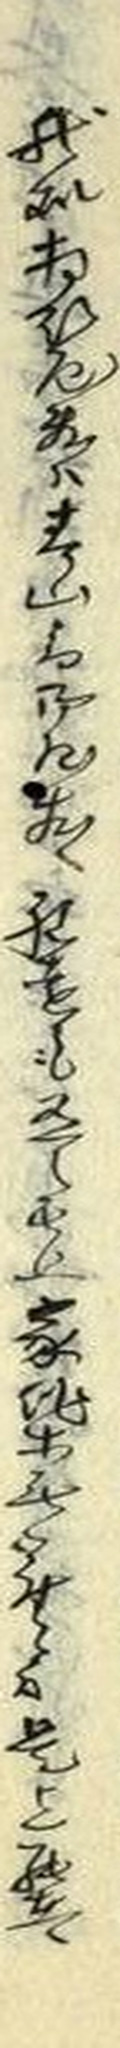然処拝領屋敷ハ青山ニ而御屋敷へ程遠ニも有之其上家作等無御座候ニ付是迄罷在候
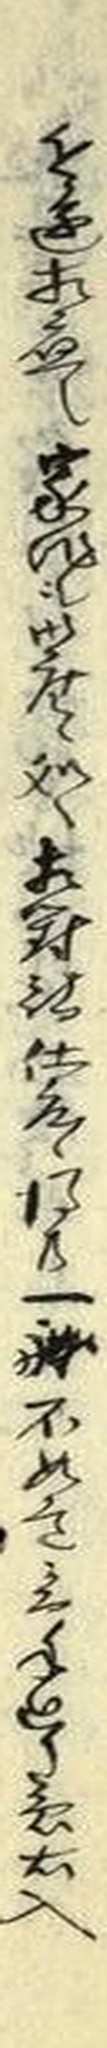近辺相応之家作も御座候処へ相対替仕度候得共一体不如意ニ而手廻り衆右入
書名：少傅日録抄（斉善付側向頭取日記、在府）
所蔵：福井県文書館 Fukui Prefectural Archives
